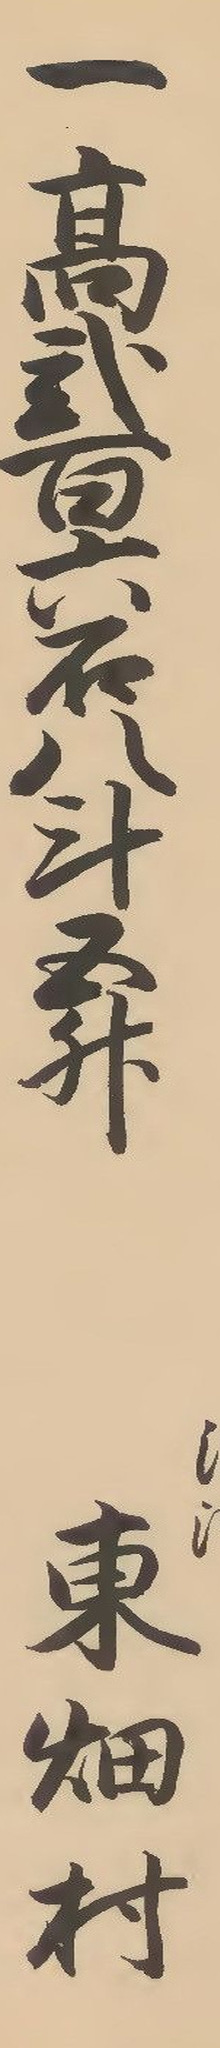一髙弐百六石八斗五升東畑村
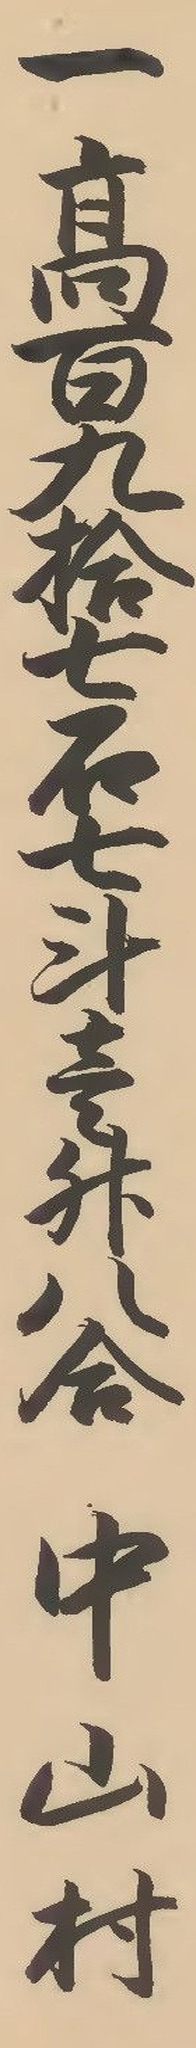一髙百九拾七石七斗壱升八合中山村
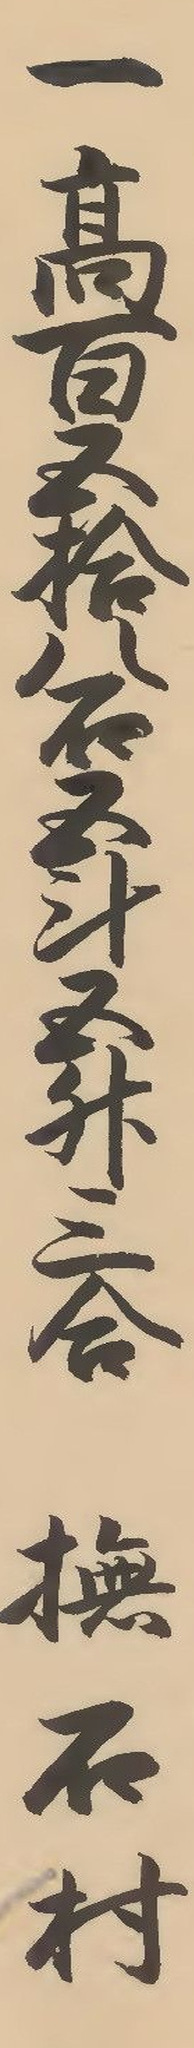一髙百五拾八石五斗五升三合撫石村

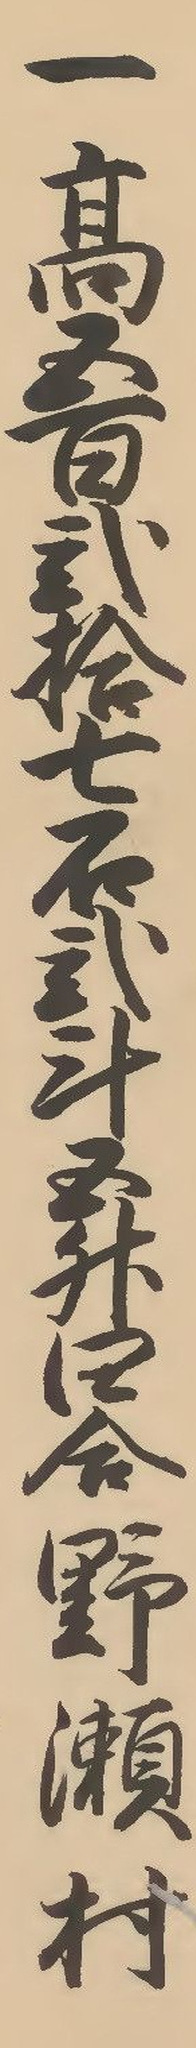一髙五百弐拾七石弐斗五升四合野瀬村
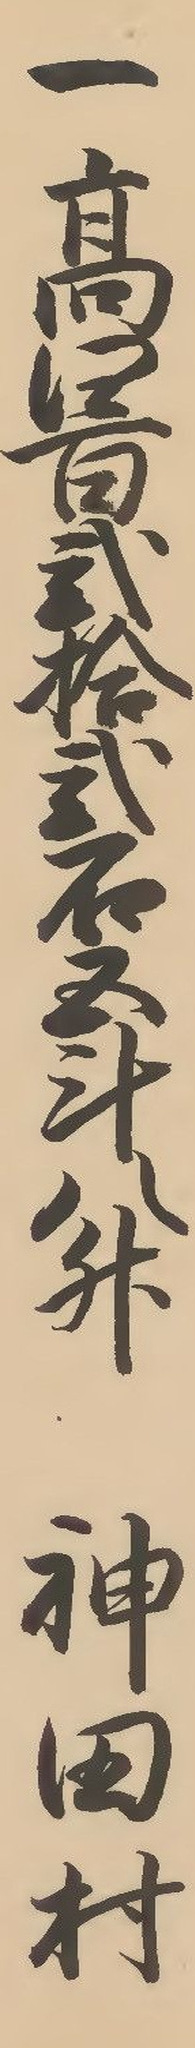一髙四百弐拾弐石五斗八升神田村
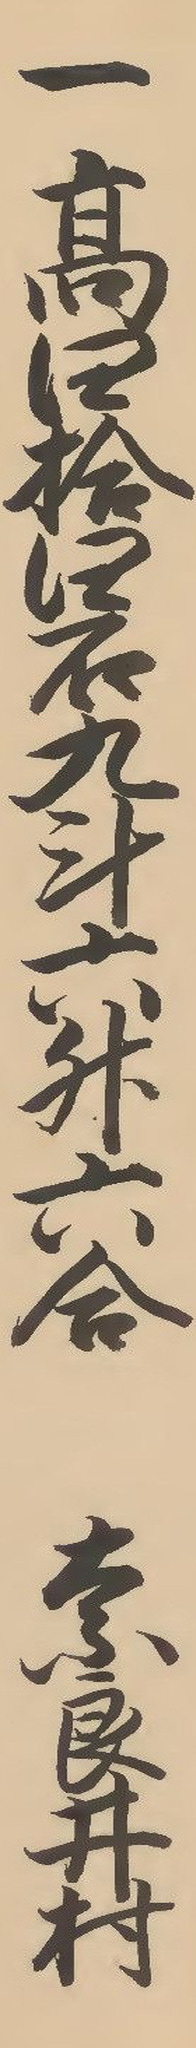一髙四拾四石九斗六升六合奈良井村
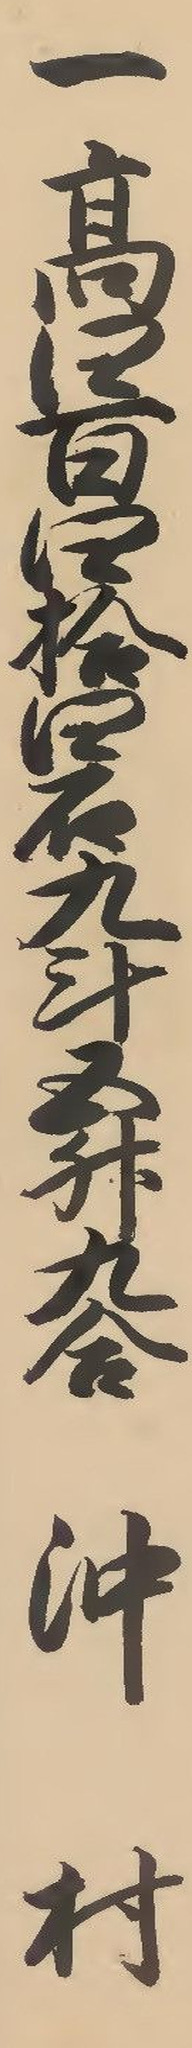一髙四百四拾四石九斗五升九合沖村
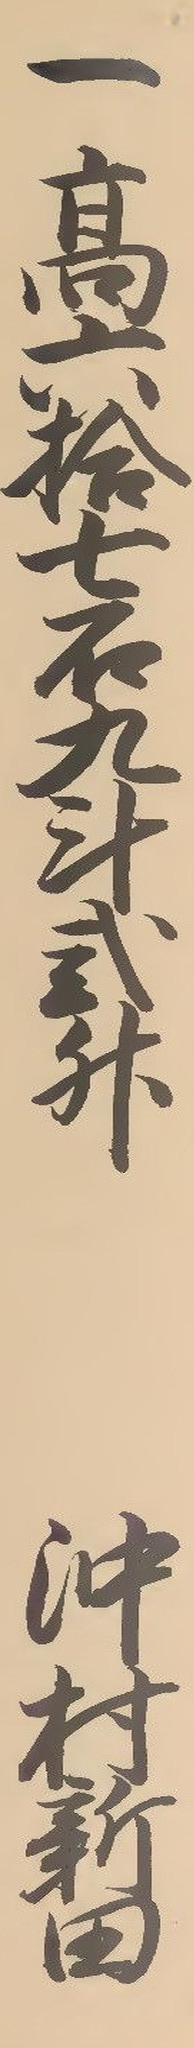一髙六拾七石九斗弐升沖村新田
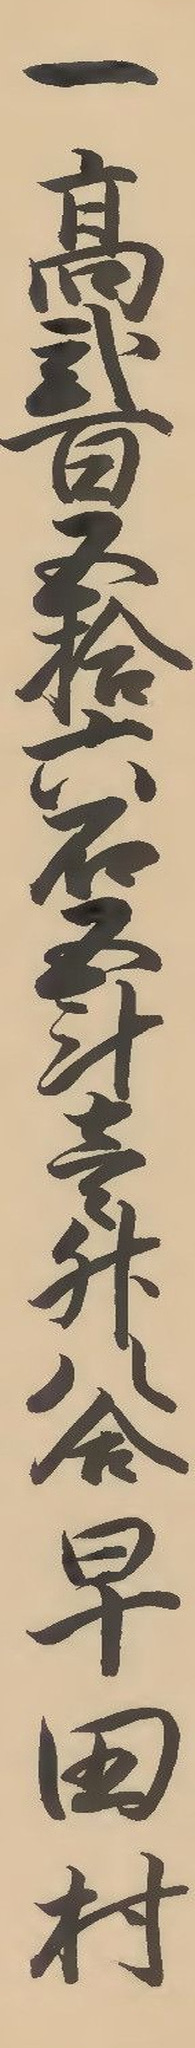一髙弐百五拾六石五斗壱升八合早田村
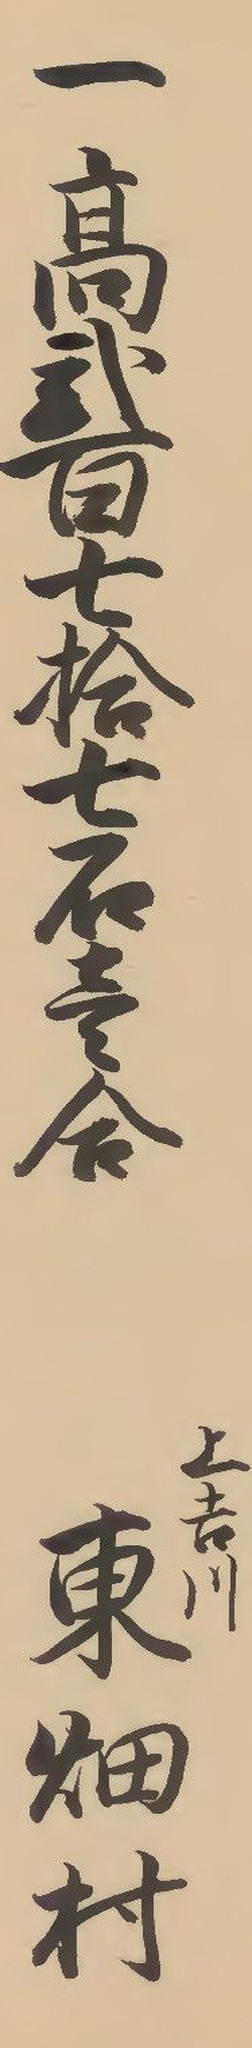一髙弐百七拾七石壱合東畑村
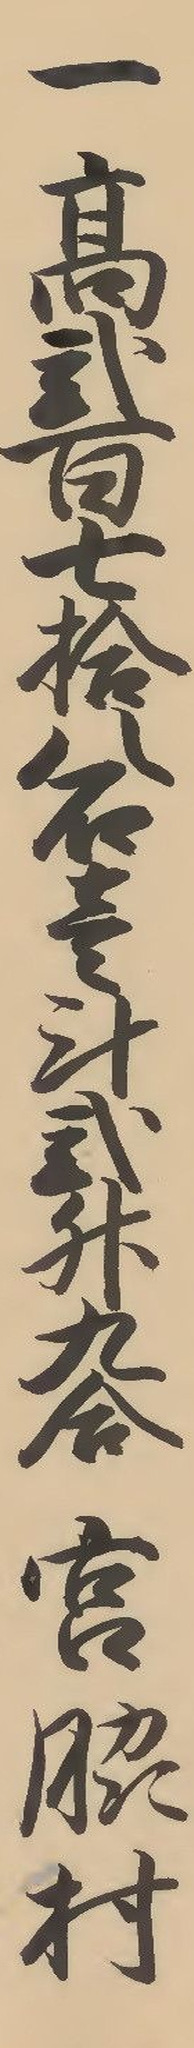一髙弐百七拾八石壱斗弐升九合宮脇村

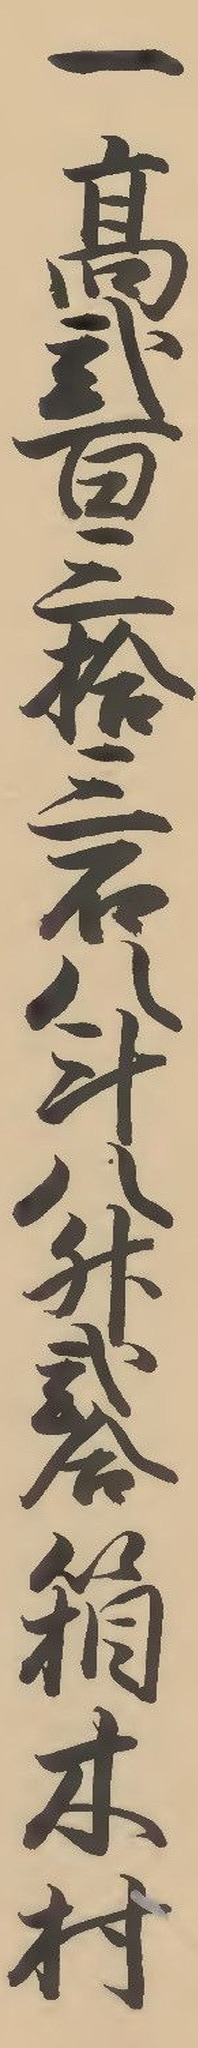一髙弐百三拾三石八斗八升弐合箱木村
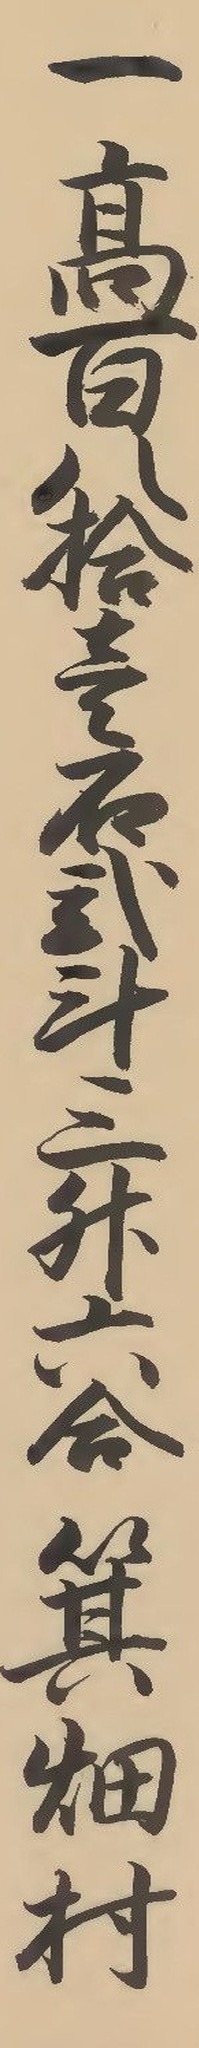一髙百八拾壱石弐斗三升六合箕畑村
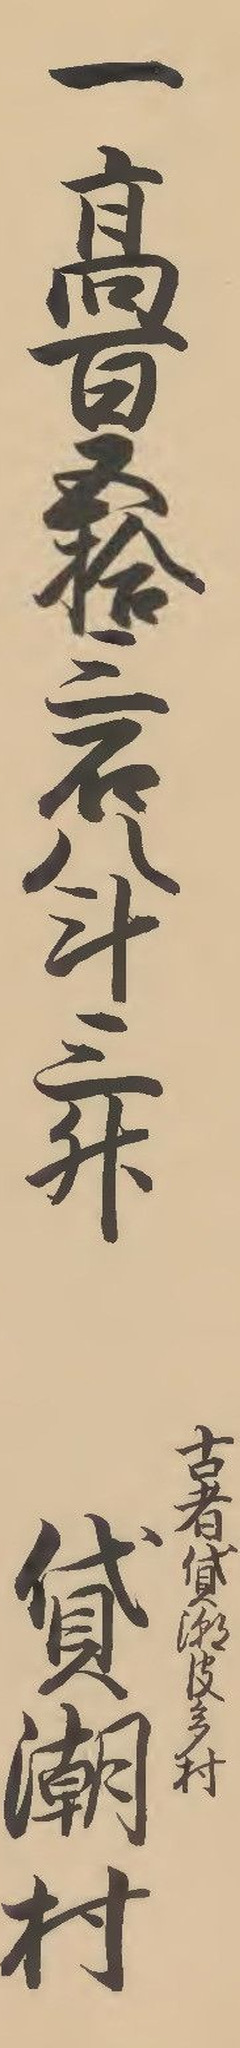一髙百五拾三石八斗三升貸潮村
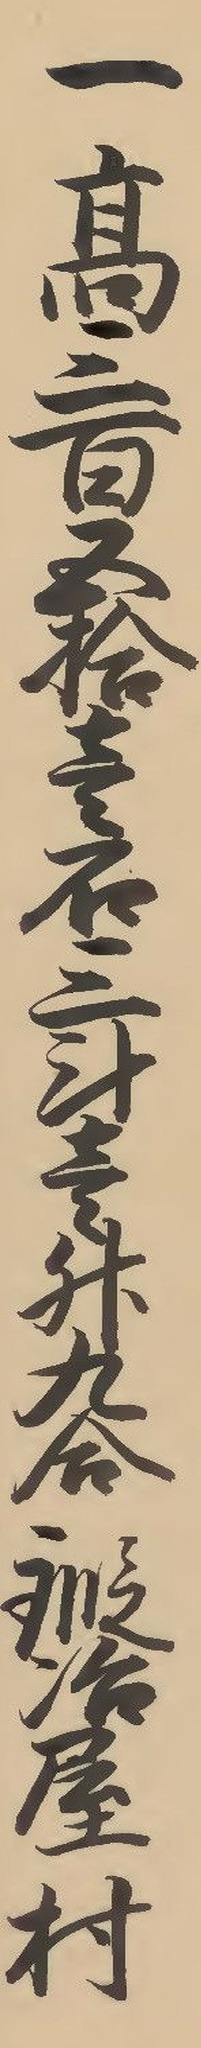一髙三百五拾壱石三斗壱升九合鍛冶屋村
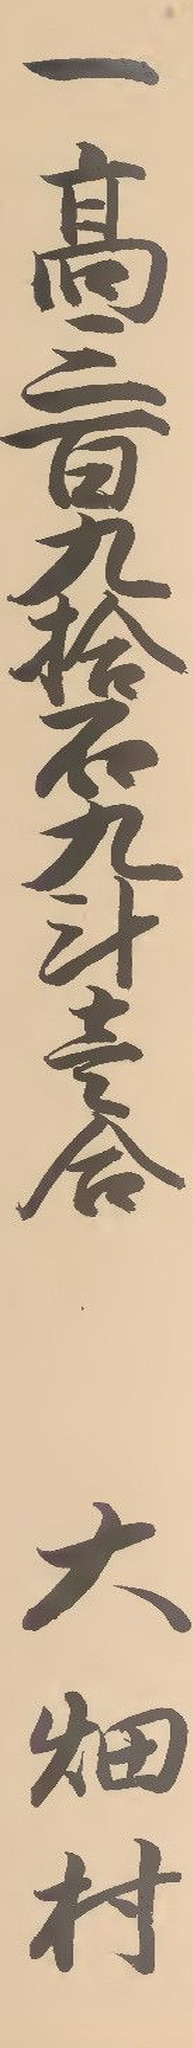一髙三百九拾石九斗壱合大畑村
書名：播磨国郷帳
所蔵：国立公文書館 National Archives of Japan
